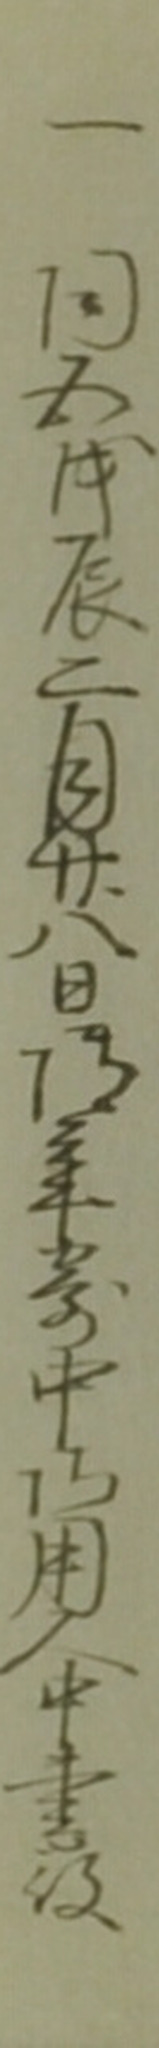一同五戌辰二月廿八日御年寄中御用人中書役
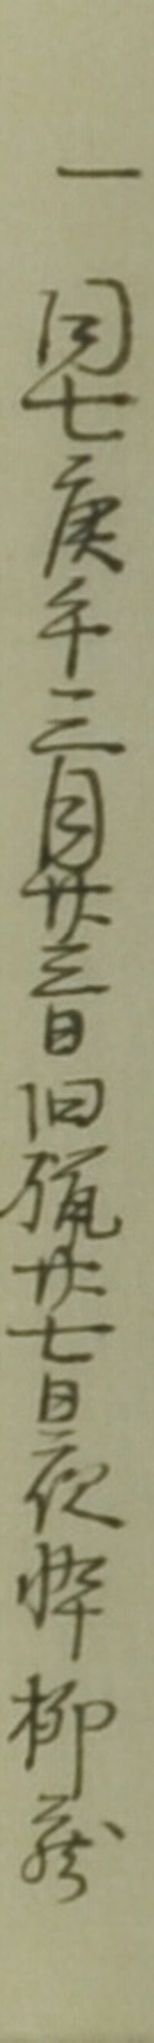一同七庚午三月廿三日旧臘廿七日夜忰柳蔵

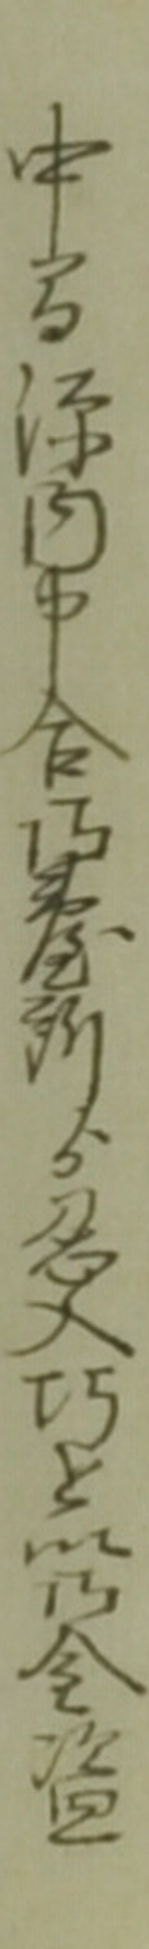中間源内申合御台所ゟ忍入巧を以御金盗
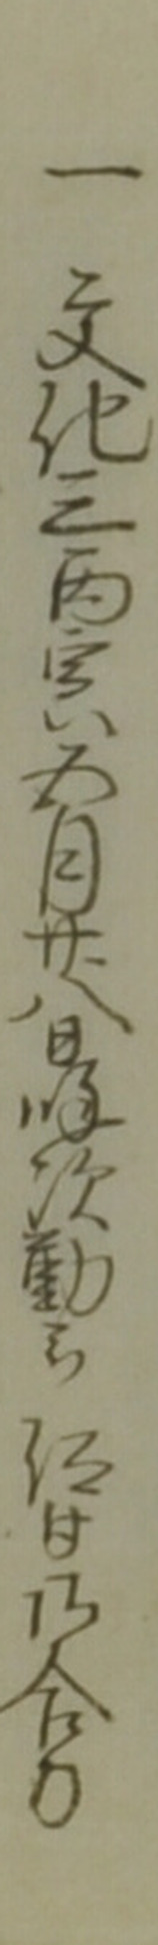一文化三丙寅五月廿八日呼次勤被仰付御合力
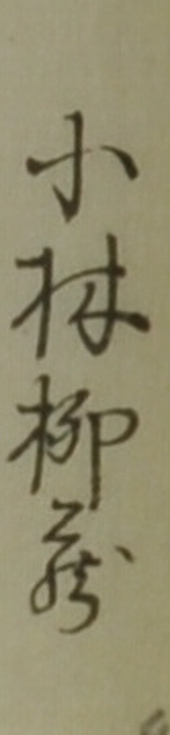小林柳蔵
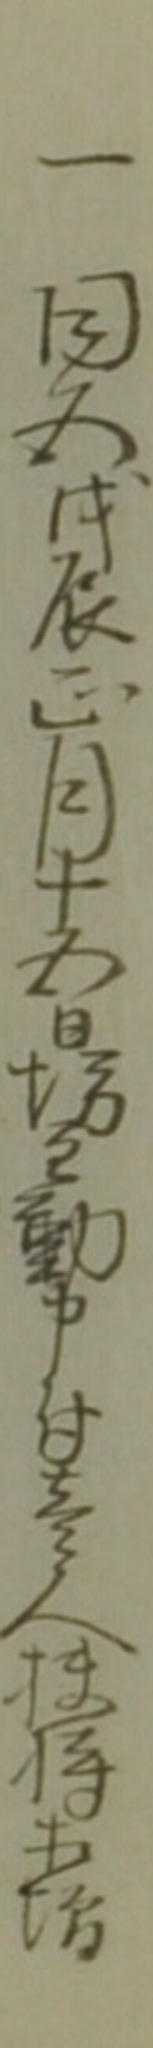一同五戊辰正月十五日坊主勤申付壱人扶持相増
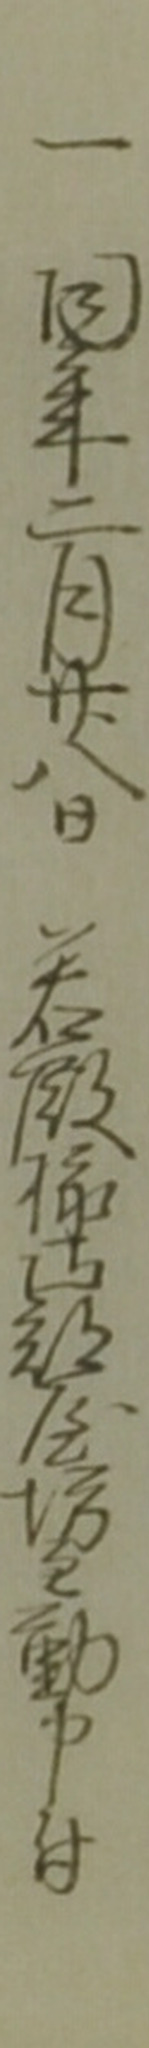一同年二月廿八日若殿様御部屋坊主勤申付
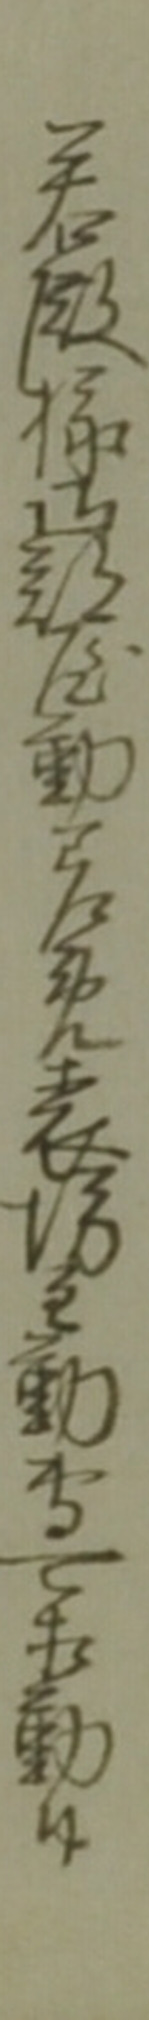若殿様御部屋差免表坊主勤専可相勤候
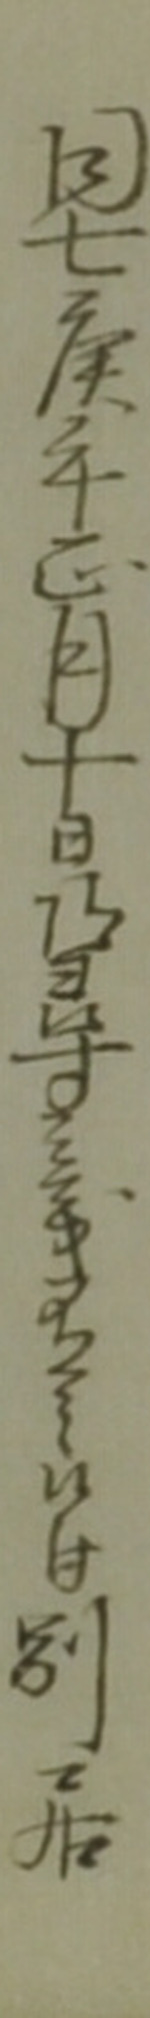一同七庚午正月十日御尋之義有之候付別居
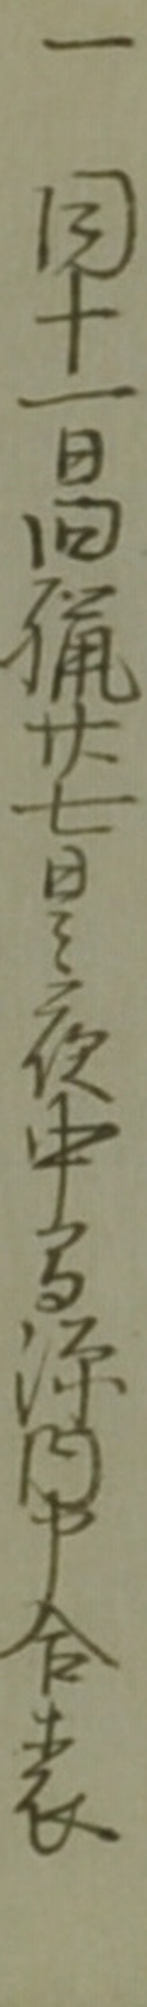一同十一日旧臘廿七日之夜中間源内申合表
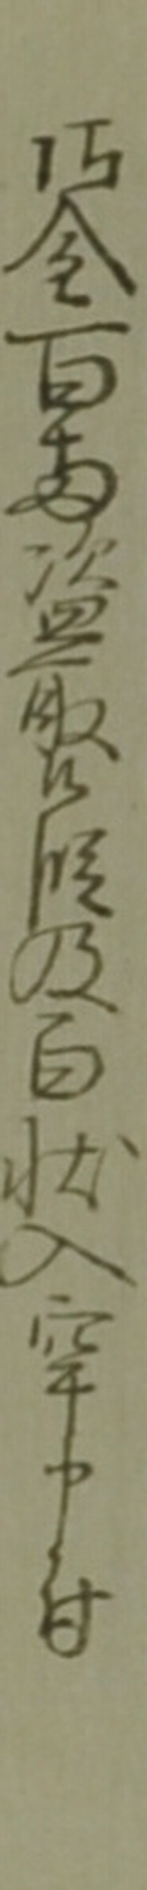御金百両盗取候段及白状入牢申付
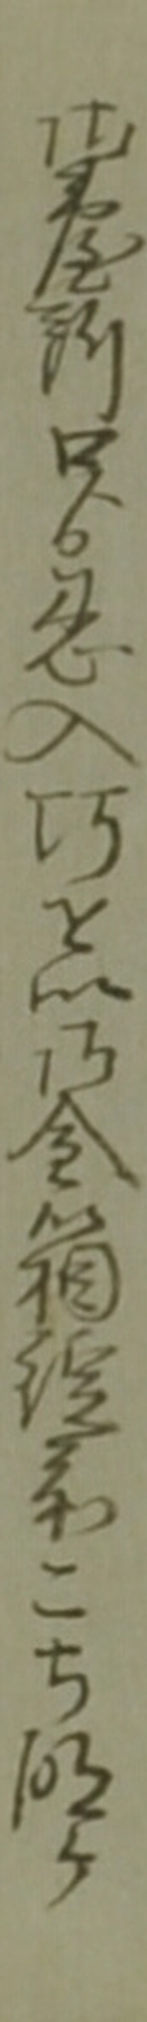御台所口ゟ忍入巧を以御金箱錠前こち明ヶ
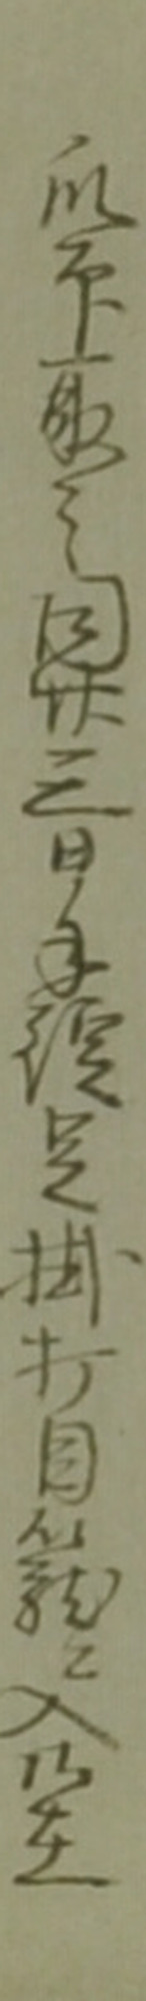瓜印取之同に廿三日手錠足掛打目籠ニ入御在
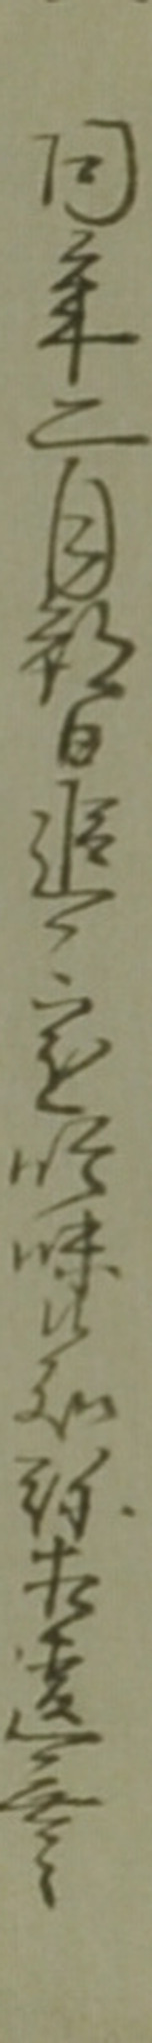一同年二月朔日追々遂吟味候処弥相違無之

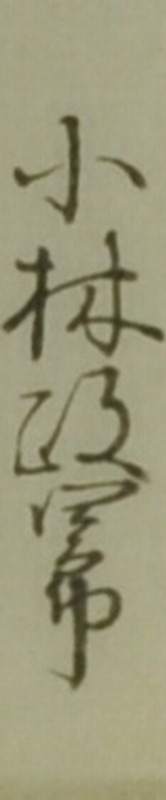小林政四郎
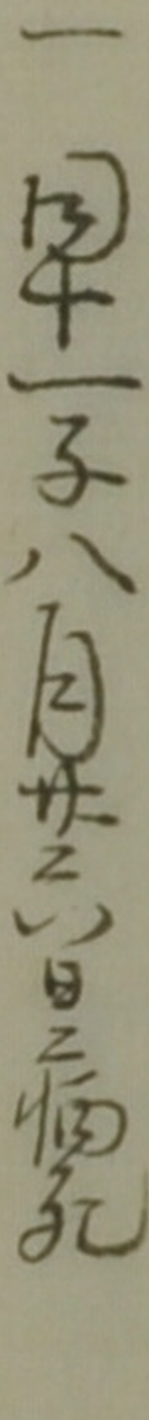一同十一子八月廿六日病死
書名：無足諸士勤仕録（七）
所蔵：伊那市立高遠町図書館・合同会社AMANE
